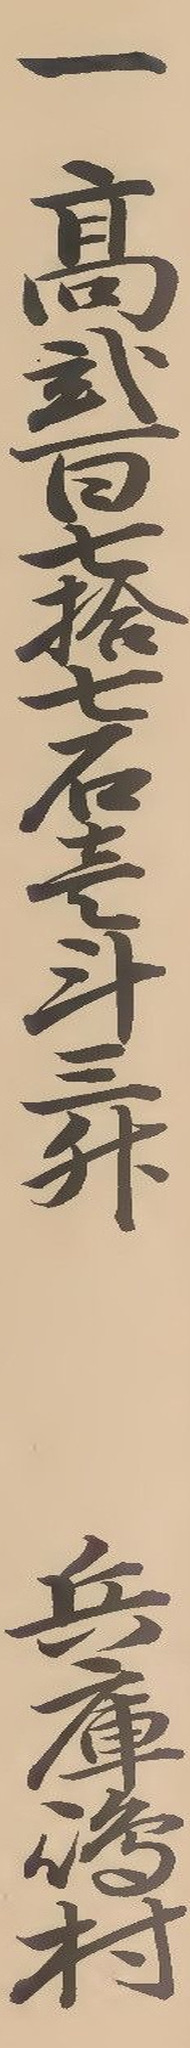一高弐百七拾七石壱斗三升兵庫島村
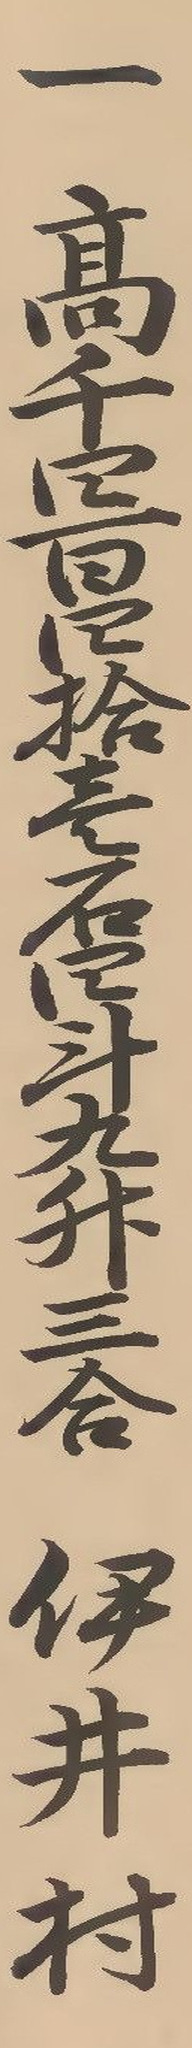一高千四百四拾壱石四斗九升三合伊井村
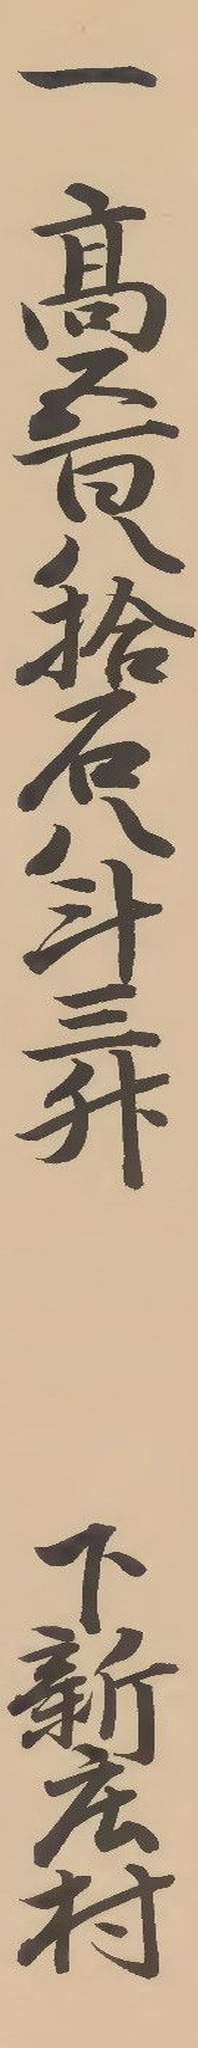一高五百八拾石八斗三升下新庄村
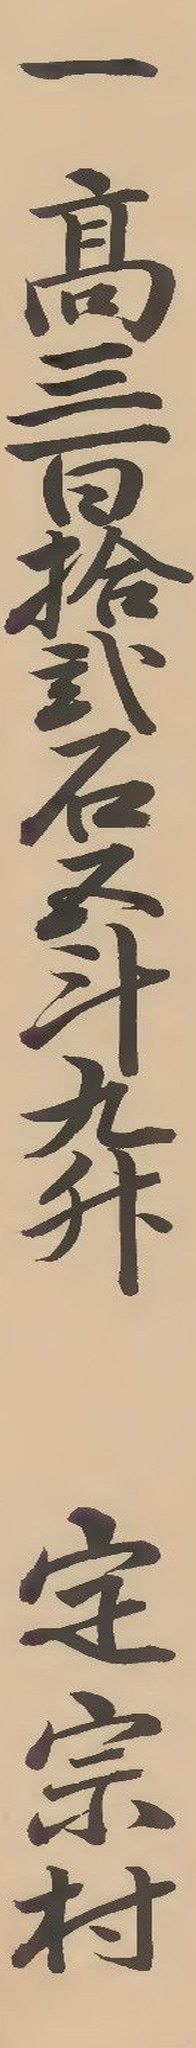一高三百拾弐石五斗九升定宗村

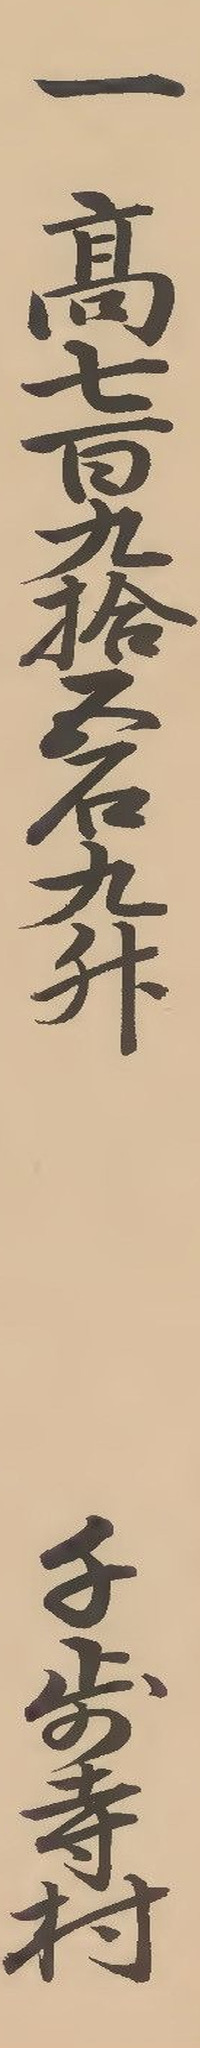一高七百九拾五石九升千歩寺村
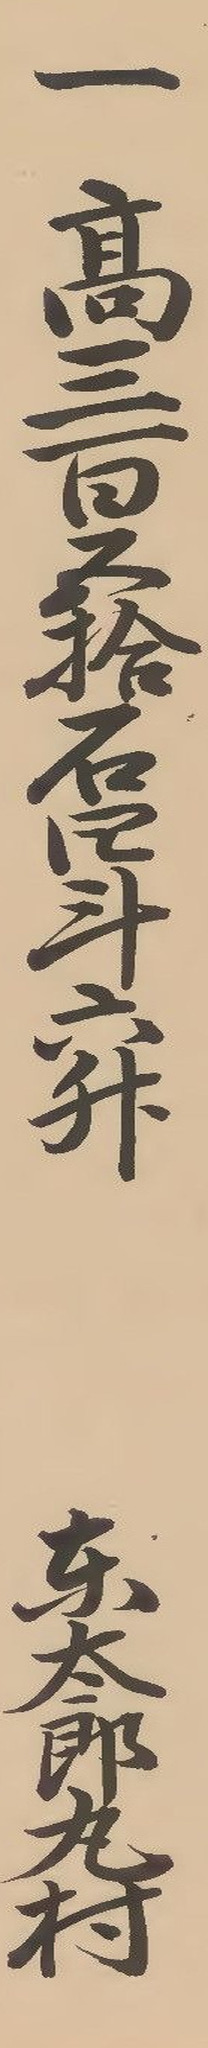一高三百五拾石四斗六升東太郎丸村
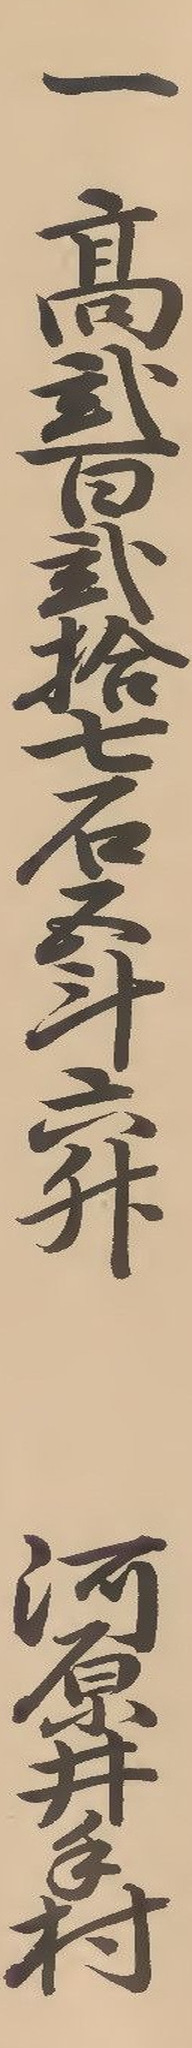一高弐百弐拾七石五斗六升河原井手村
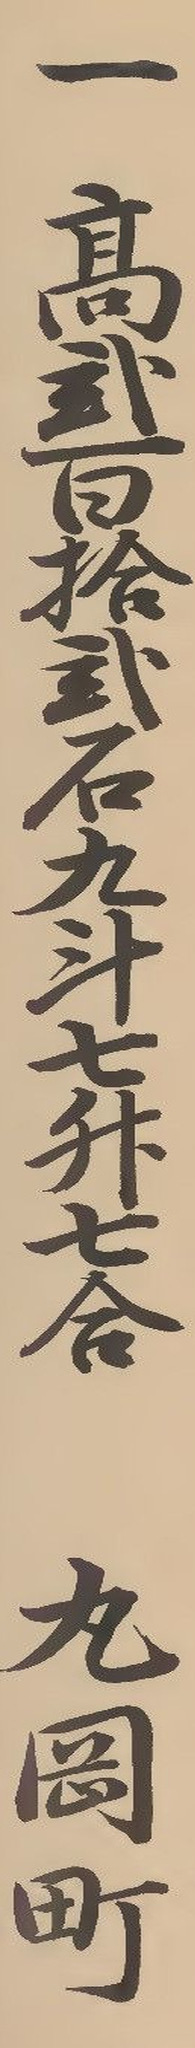一高弐百拾弐石九斗七升七合丸岡町
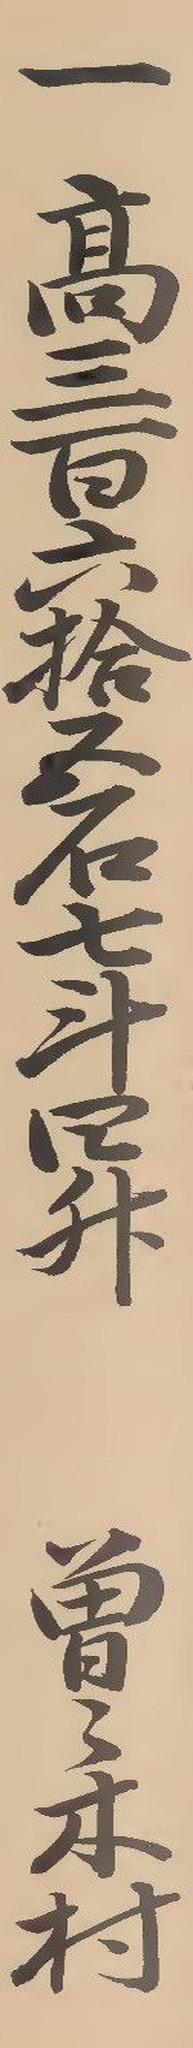一高三百六拾五石七斗四升曽々木村
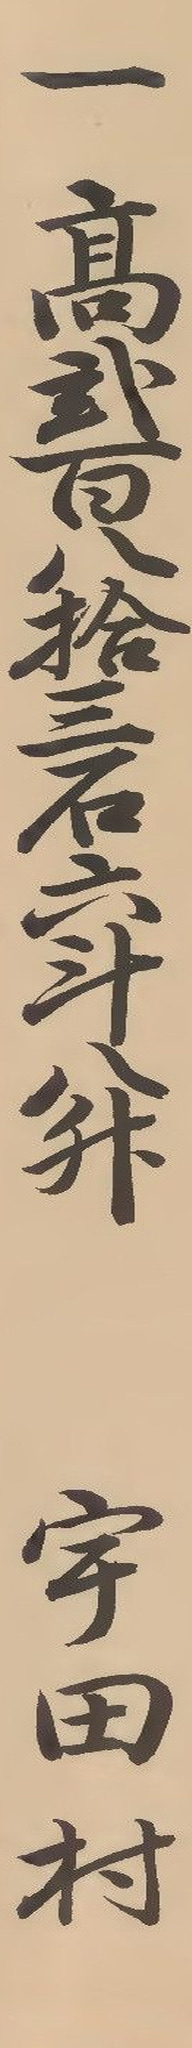一高弐百八拾三石六斗八升宇田村
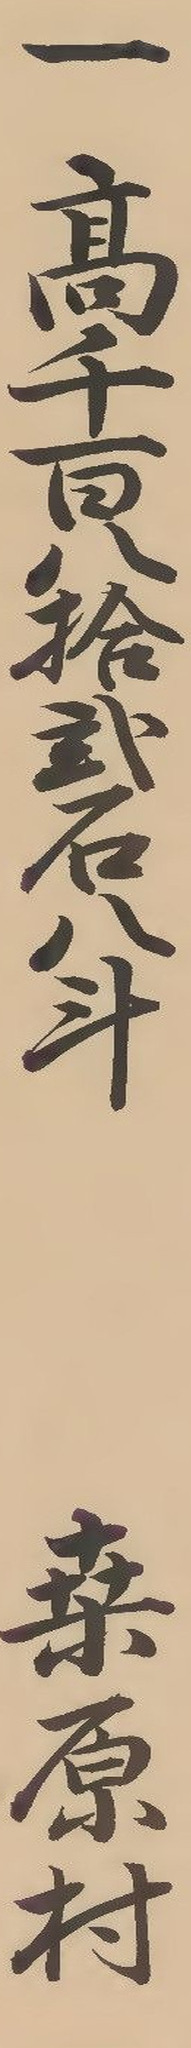一高千百八拾弐石八斗桑原村

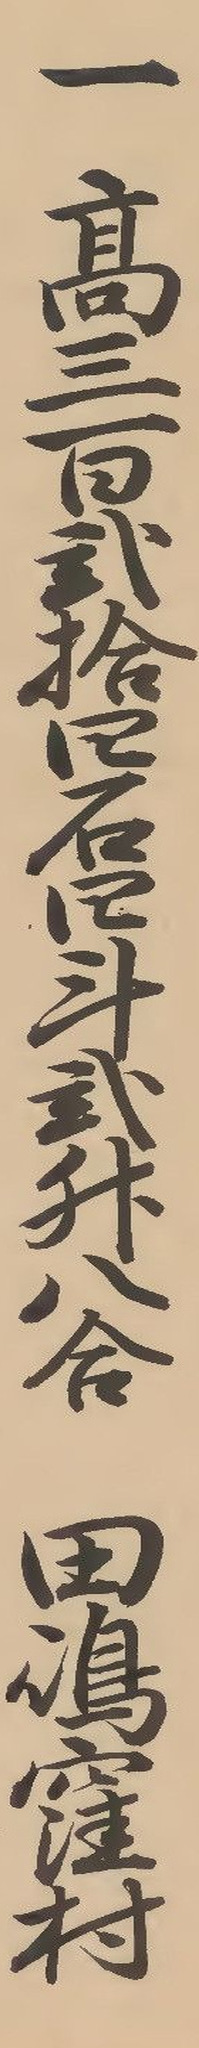一高三百弐拾四石四斗弐升八合田島窪村
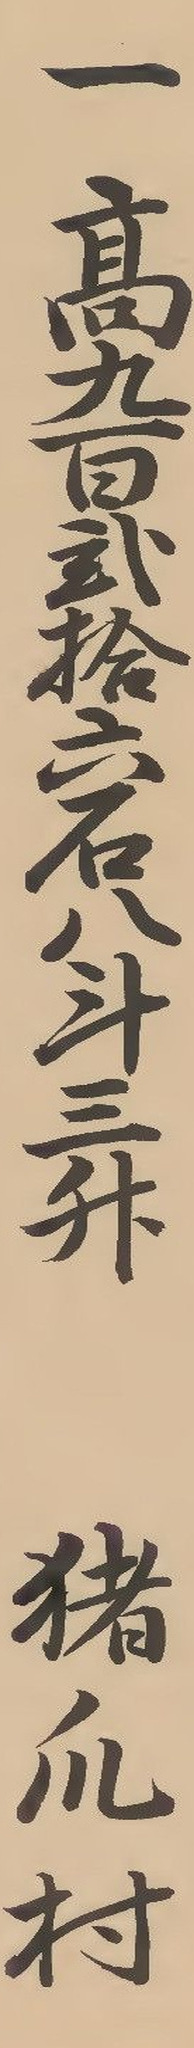一高九百弐拾六石八斗三升猪爪村
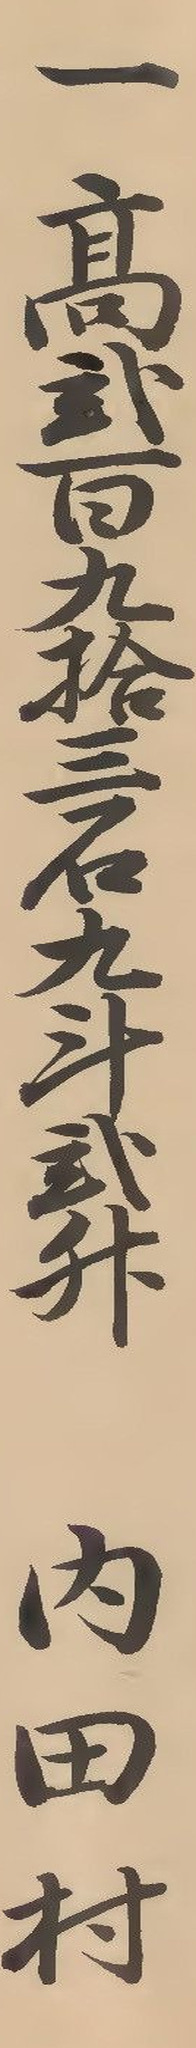一高弐百九拾三石九斗弐升内田村
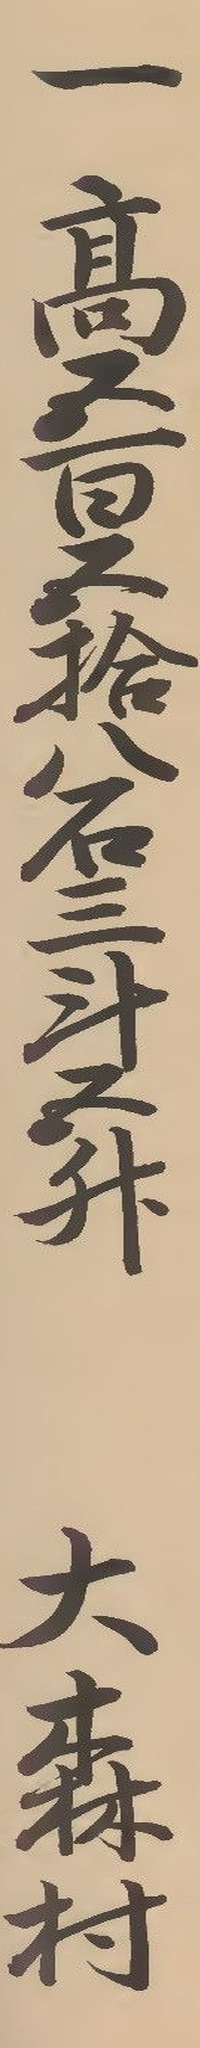一高五百五拾八石三斗五升大森村
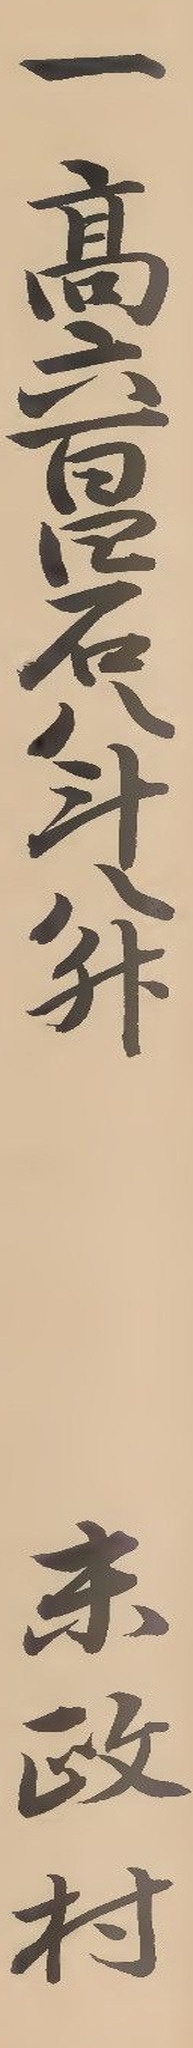一高六百四石八斗八升末政村
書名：越前国郷帳
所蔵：国立公文書館 National Archives of Japan
